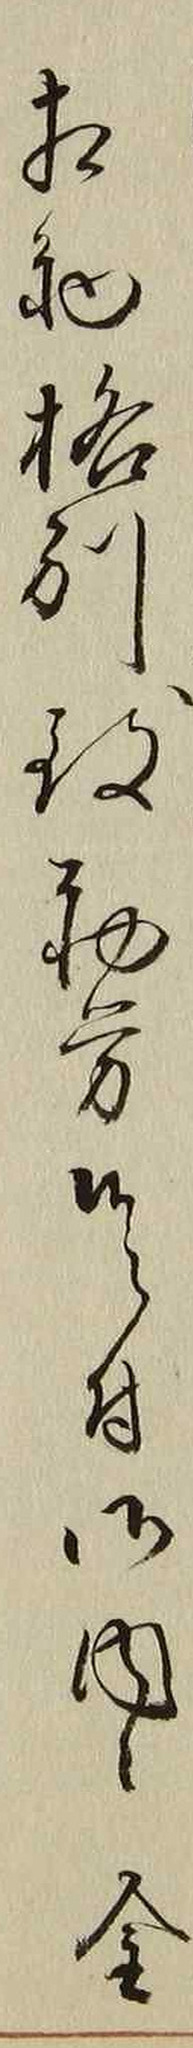相勤格別致勤労候に付御内々金
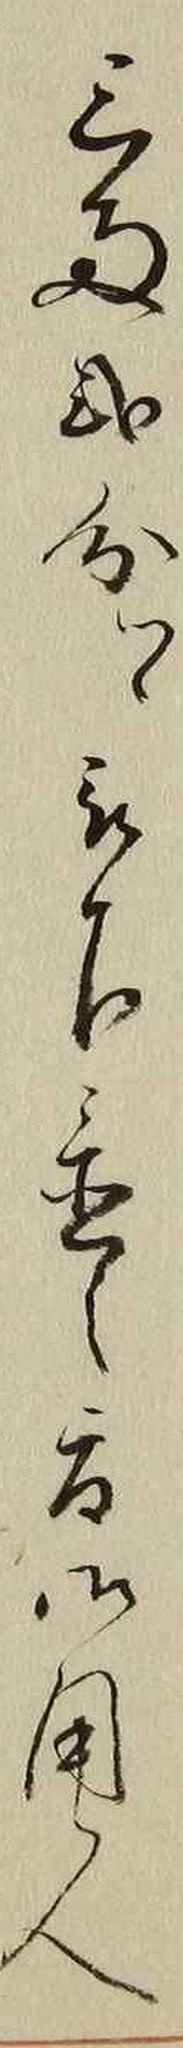三両弐分ツヽ被下置の旨御用人
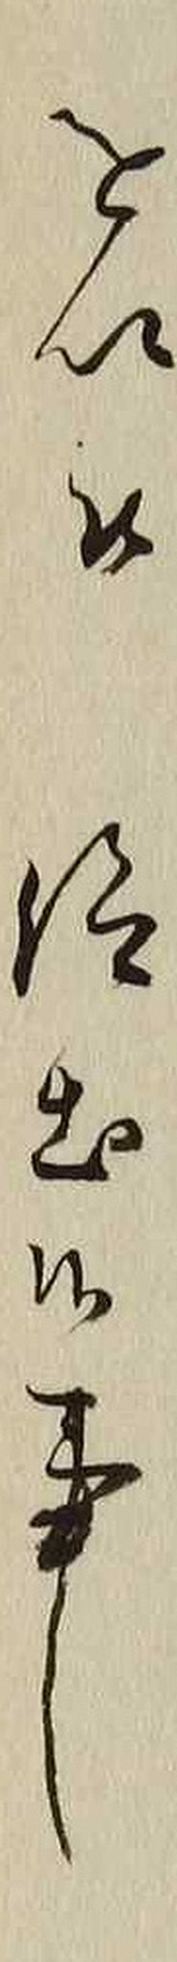を以被仰出候事
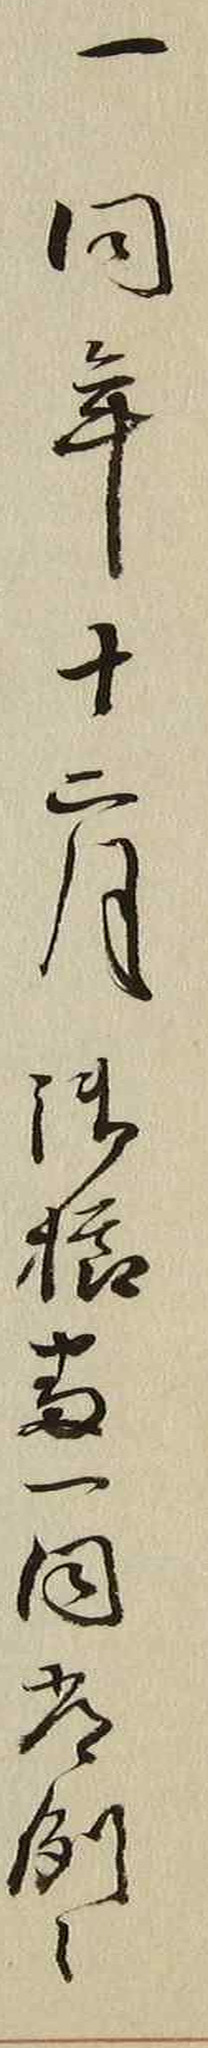一同年十二月御様番一同常例の
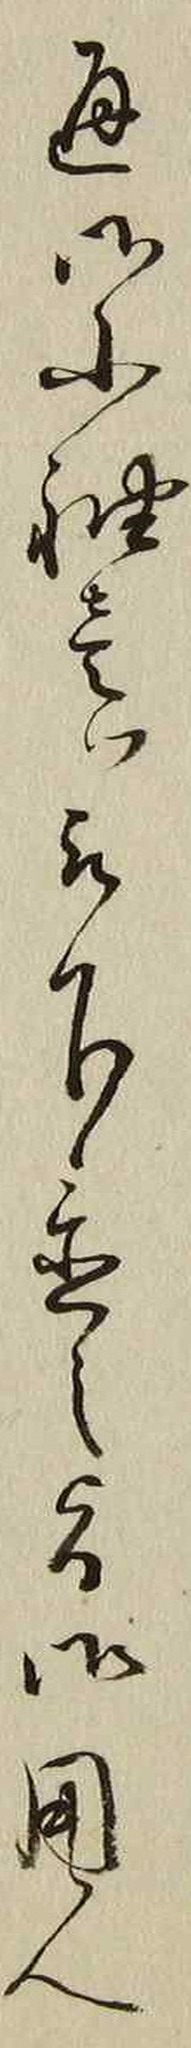通御小袖壱ツ被下置の旨御用人
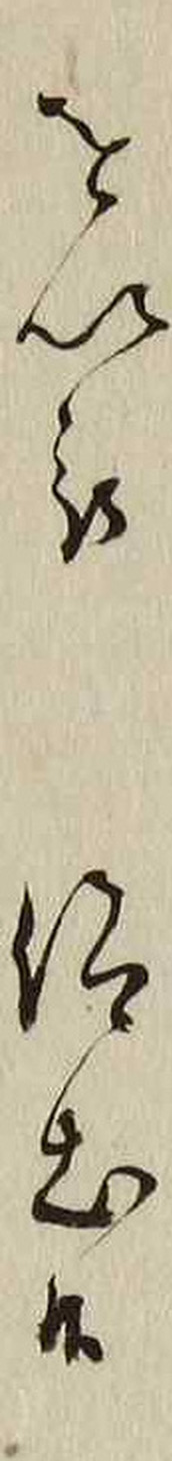を以被仰出候
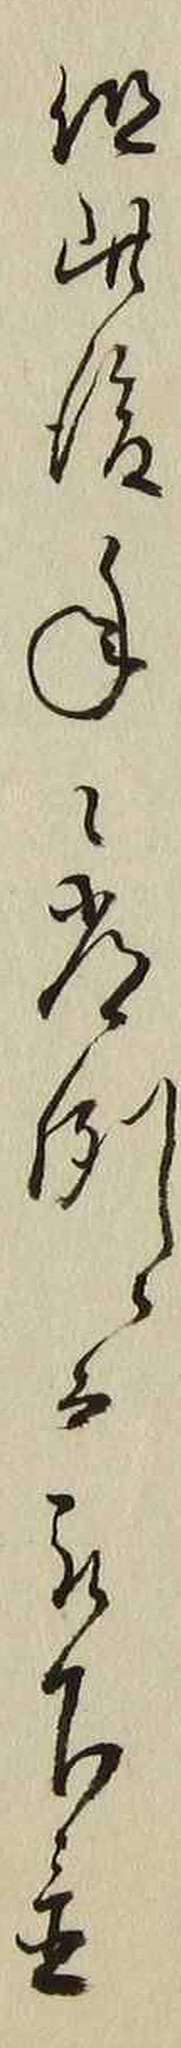但此後年々常例に而被下置
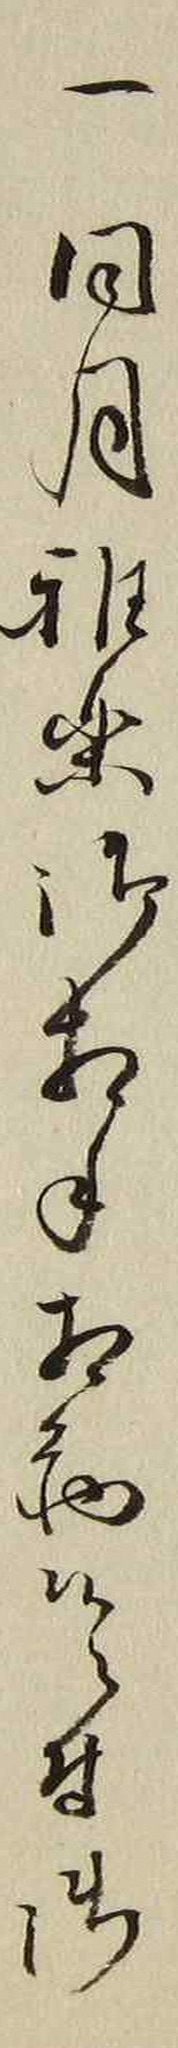一同月雅楽御相手相勤候に付御
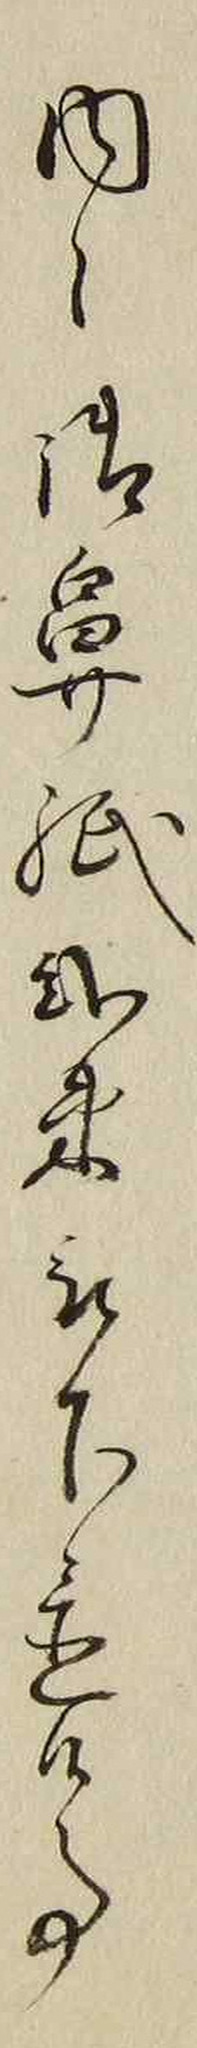内々御鼻紙弐束被下置候事
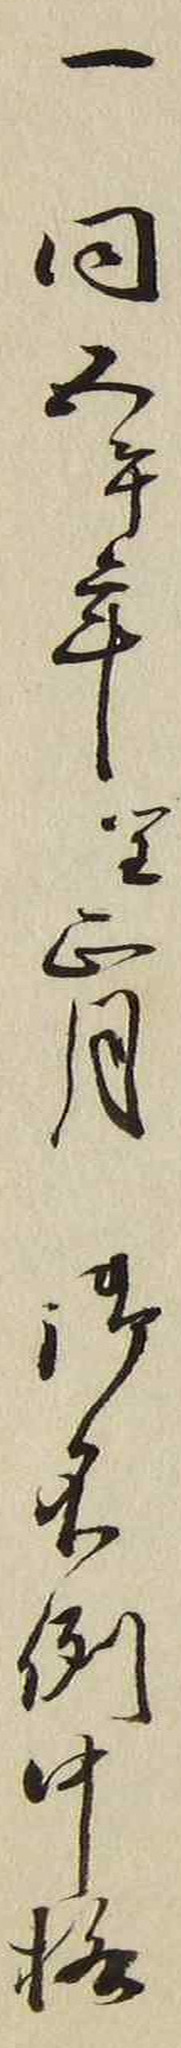一同年五午年閏正月御不例中格

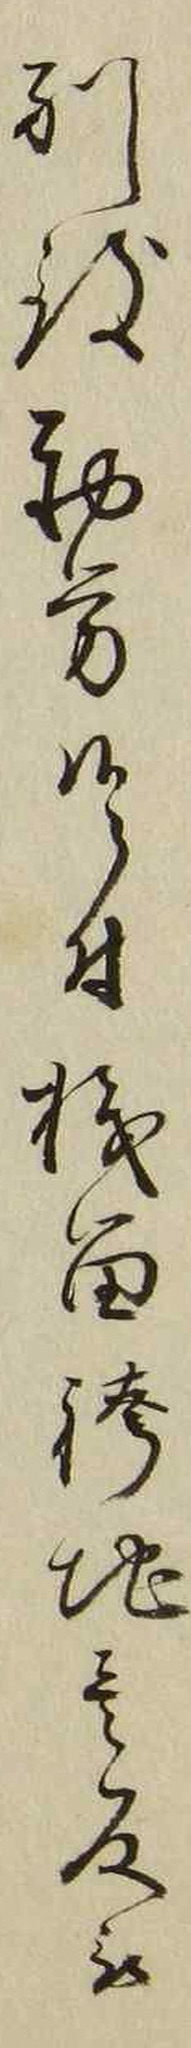別致勤労候に付桟留袴地壱反被
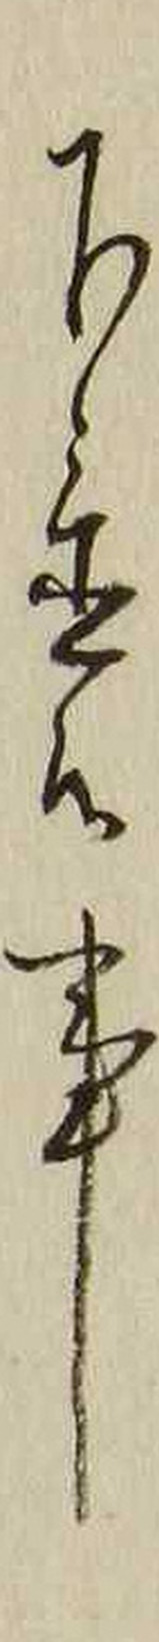下置候事
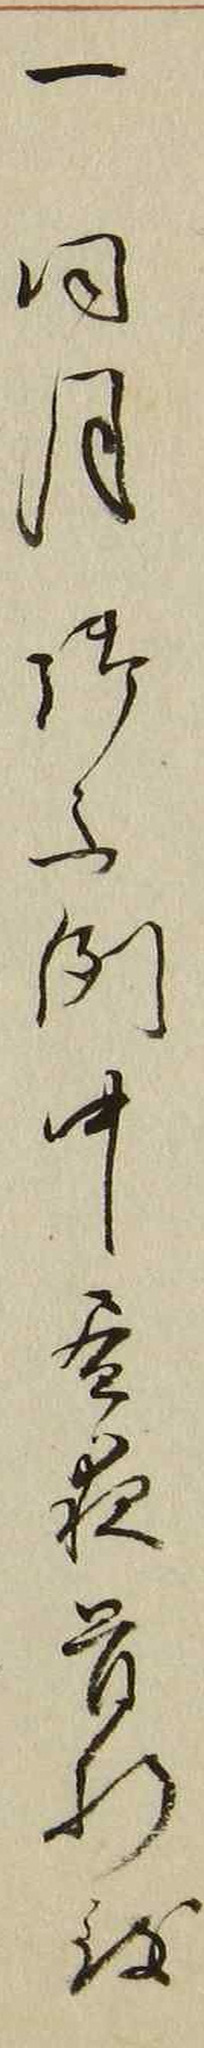一同月御不例中昼夜骨折致
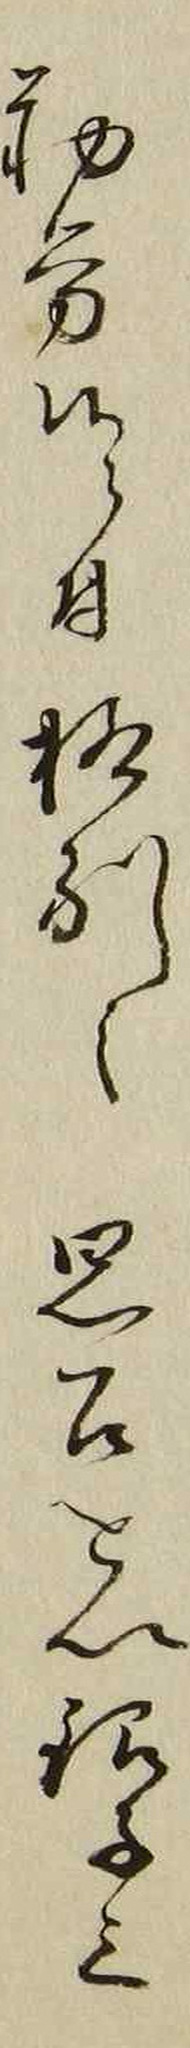勤労候に付格別の思召を以銀子三
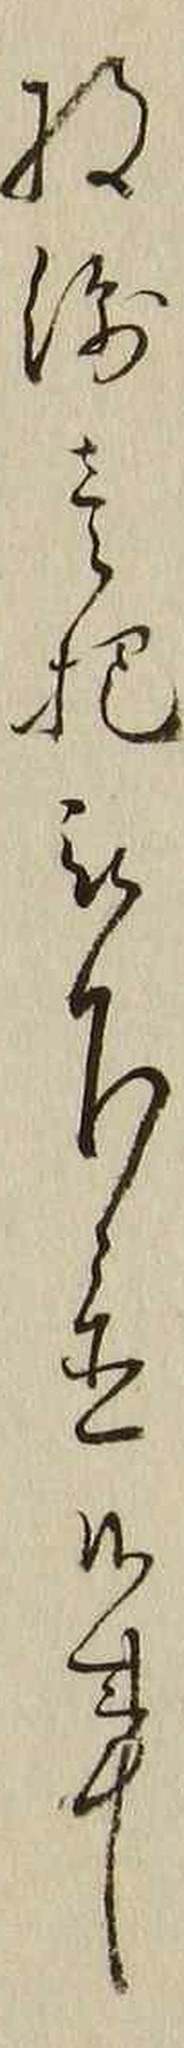枚綿壱把被下置候事
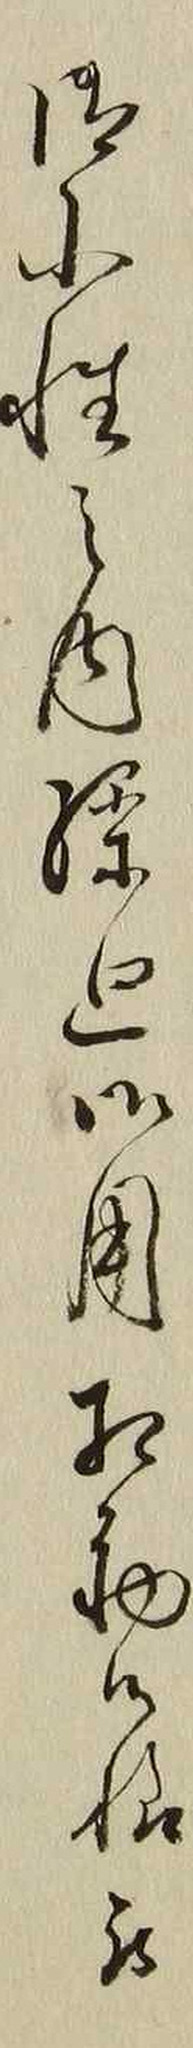御小性の内繰廻御用相勤候様被
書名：諸士系譜　巻之1　い之部1
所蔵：会津若松市立会津図書館
